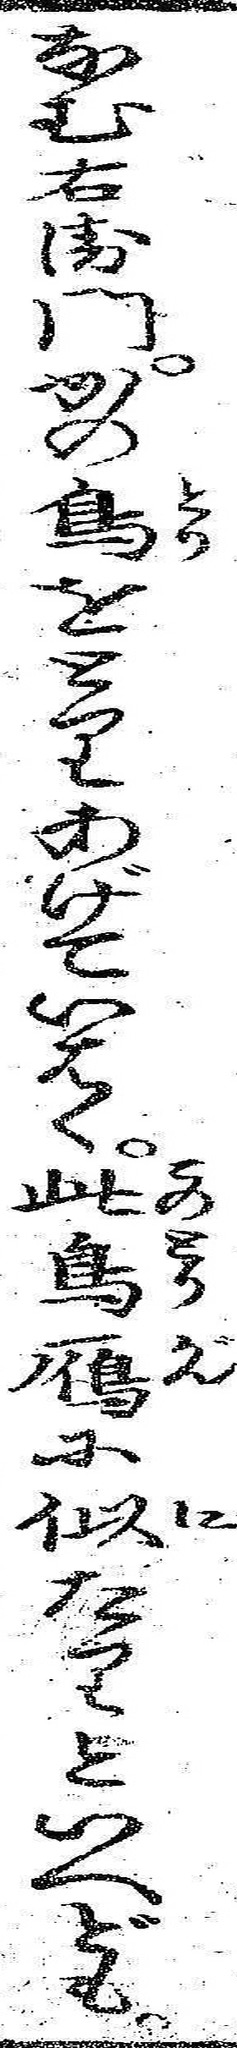なむ右衛門。かの鳥をとりあげていはく。此鳥雁に似たりといへども。
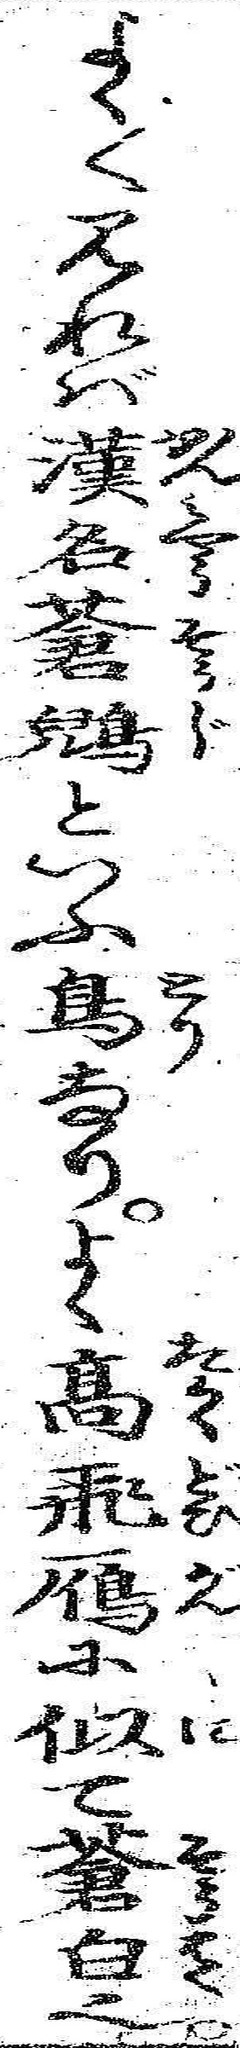よく〳〵見れば漢名蒼鶂といふ鳥なり。よく高飛雁に似て蒼白也。

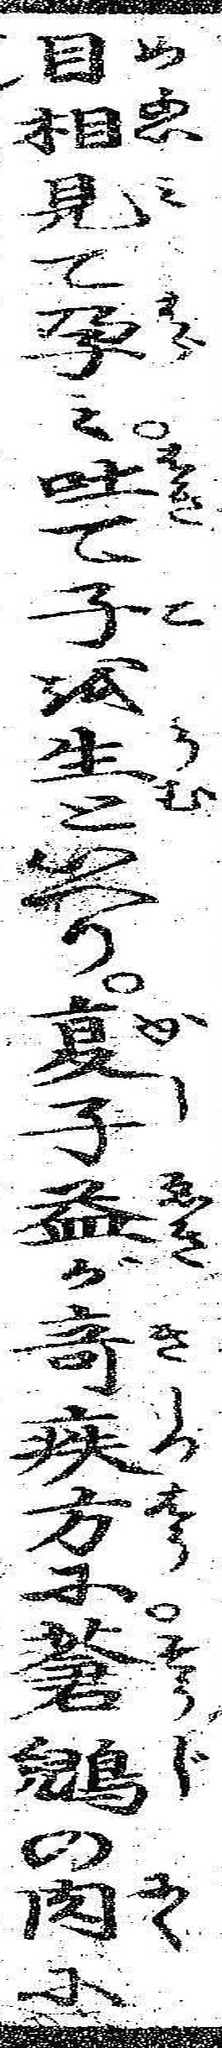目相見て孕み。吐て子を生といへり。夏子益が奇疾方に。蒼鶂の肉に
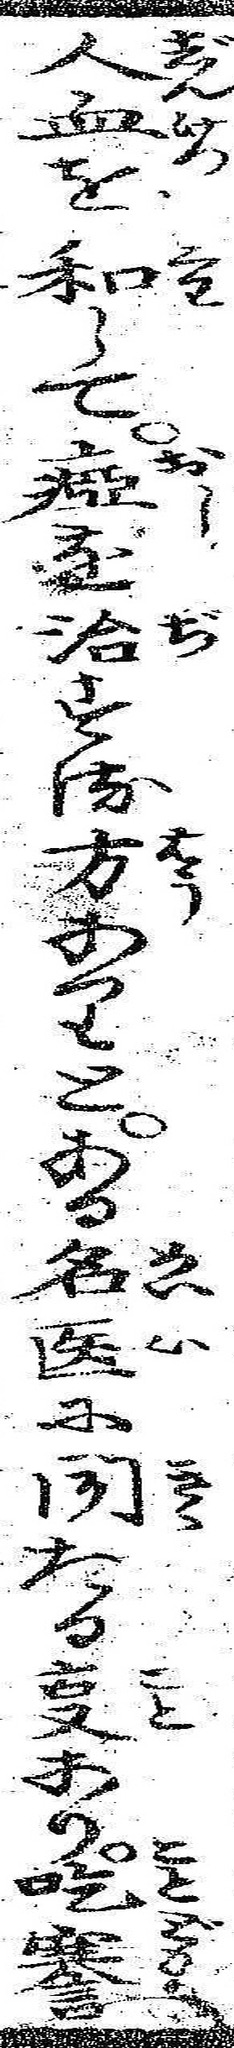人血を和して。瘂を治する方ありと。ある名医に聞たる事あり。吃謇
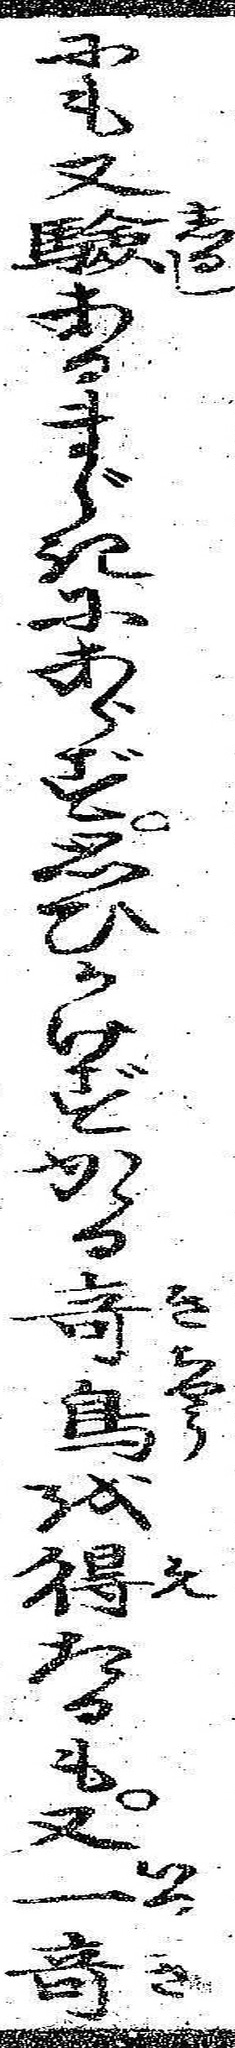にも又験あるまじきにあらず。思ひかけずかゝる奇鳥を得たるも。又一奇
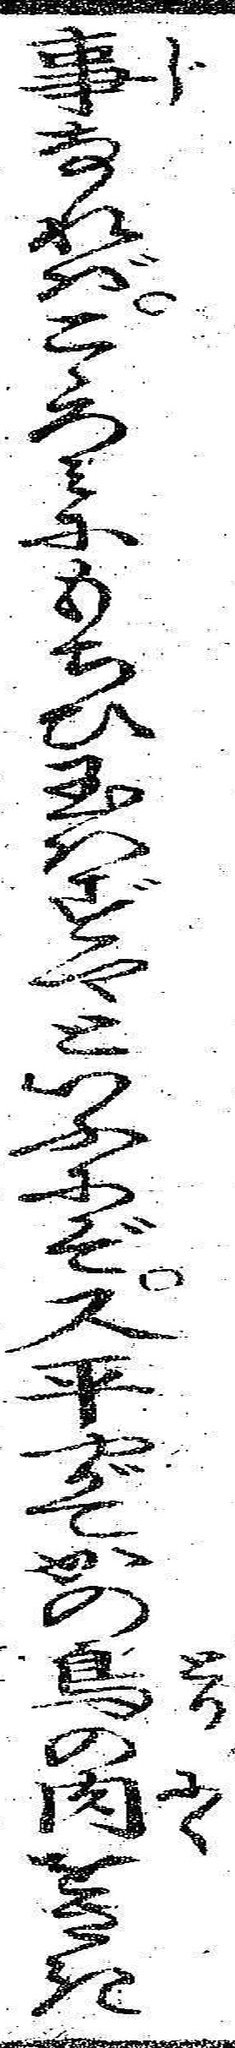事なれば。こゝろみにもちひ玉はずやといふにぞ。又平やがてかの鳥の肉をさき
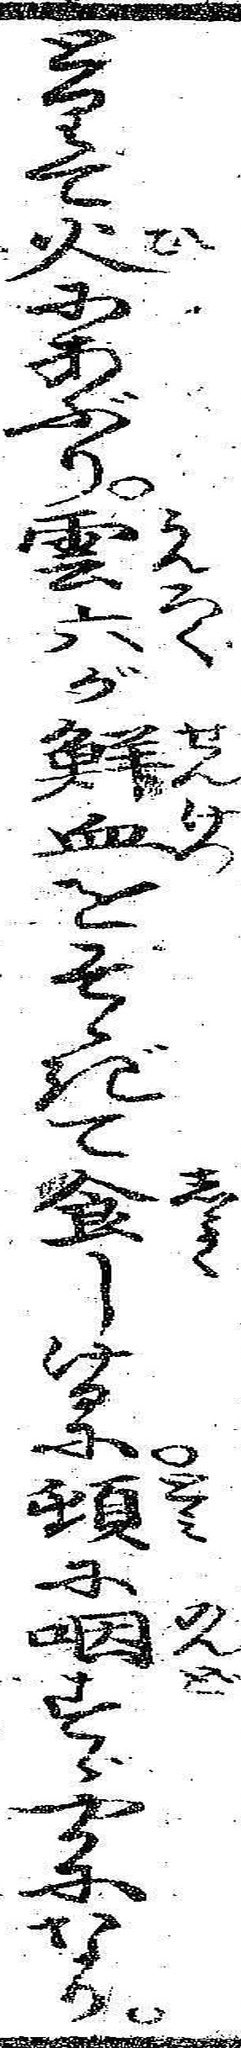とりて火にあぶり。雲六が鮮血をそゝぎて食しけるに。頓に咽すゞやかになり。
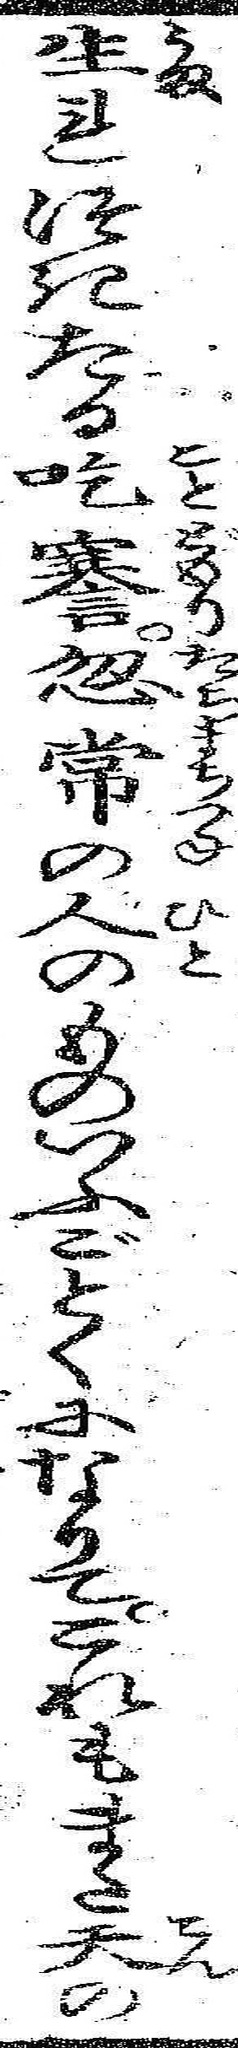生れつきたる吃謇。忽常の人のものいふごとくになりて。これもまた天の
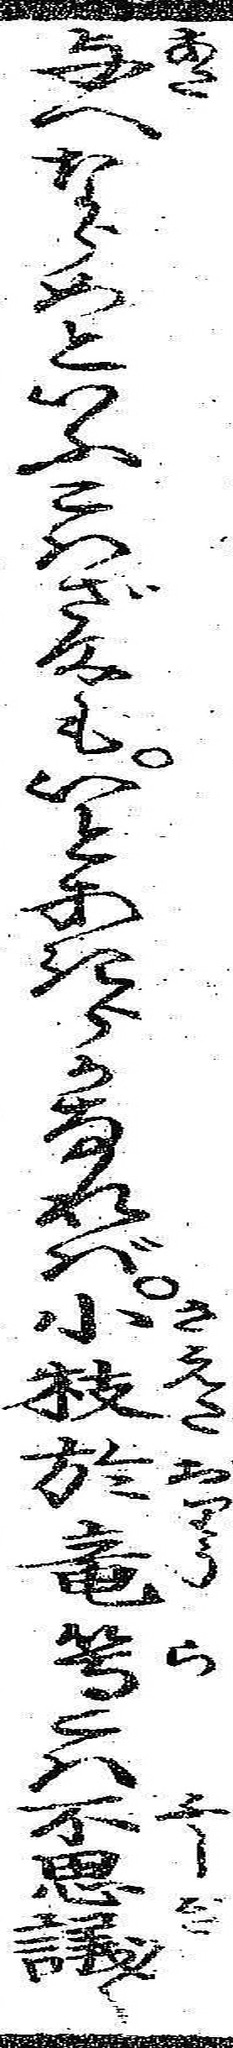与へならめといふこはざまも。いとあきらかなれば。小枝於竜等こは不思議〳〵
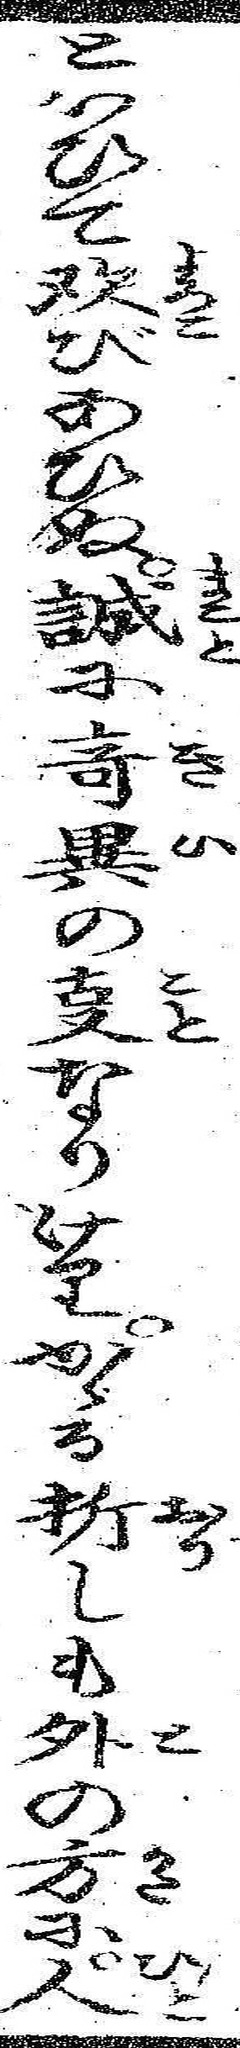といひて歓びあひぬ。誠に奇異の事なりけり。かゝる折しも外の方に。人
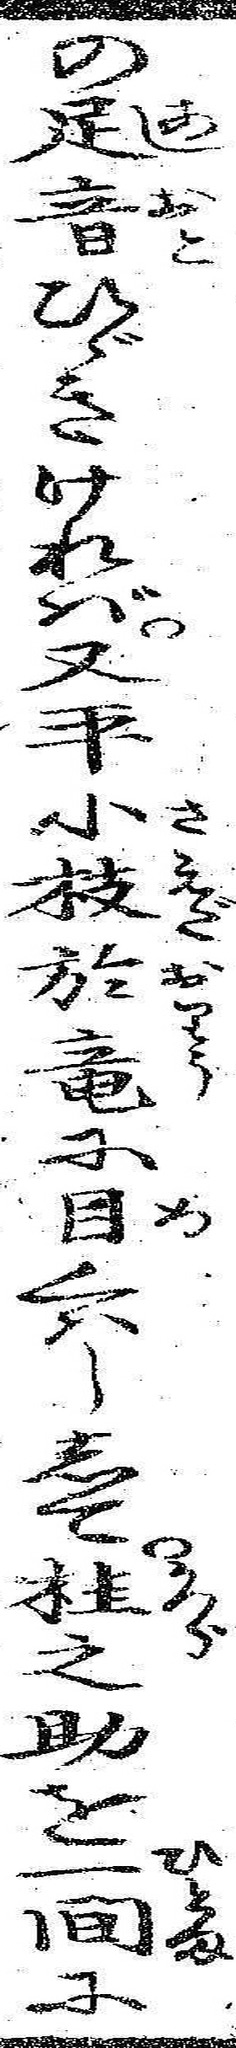の足音ひゞきければ。又平小枝於竜に目くはしして。柱之助を一間に
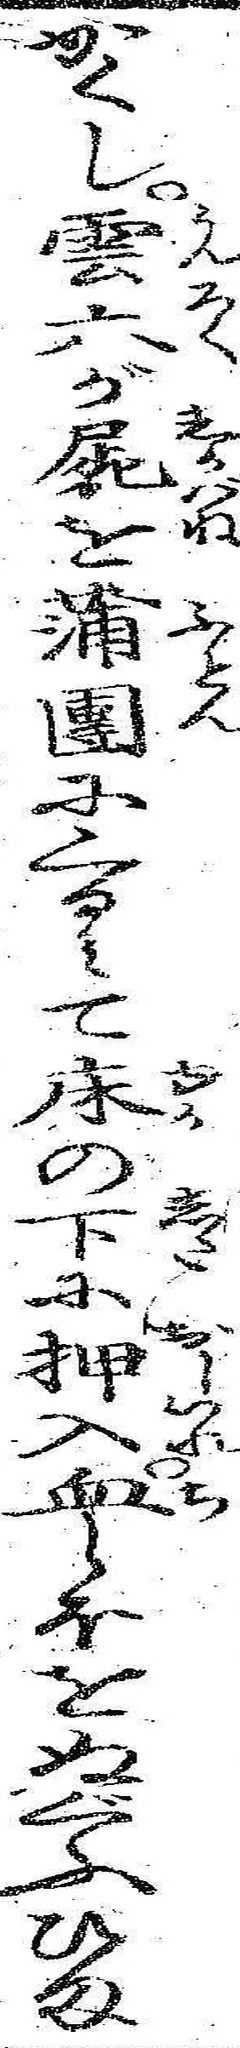かくし。雲六が屍を蒲団にくるみて床の下に押入。血しほをぬぐふひま
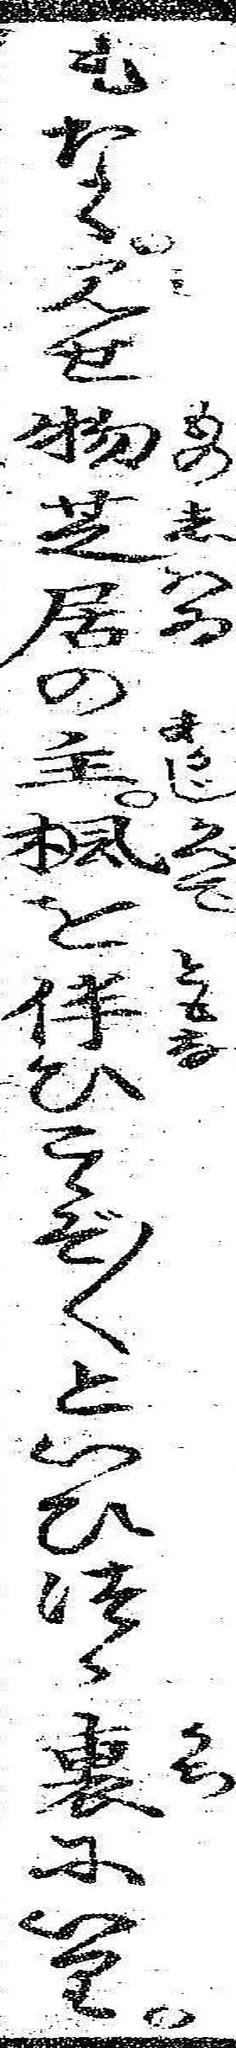もなく。見せ物芝居の主。楓を伴ひこゝぞ〳〵といひつゝ裏にいり。
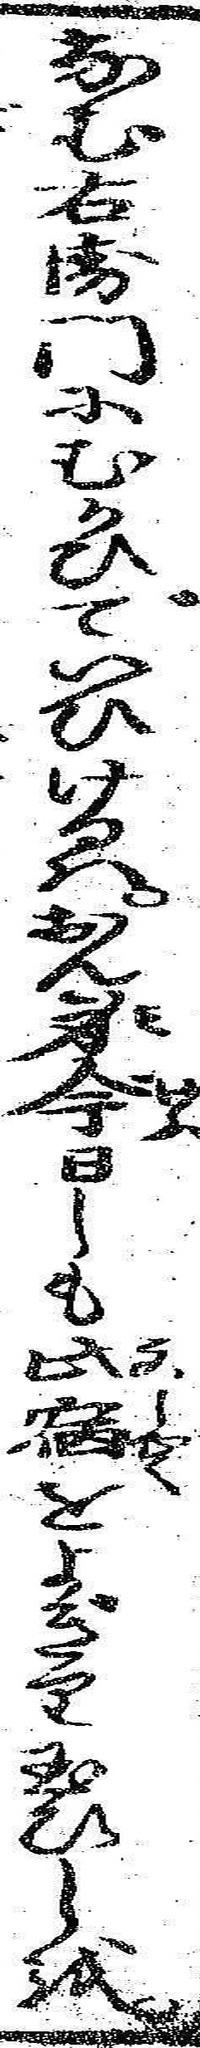なむ右衛門にむかひていひけるは。おん身今日しも此宿をよぎり玉ひしを。
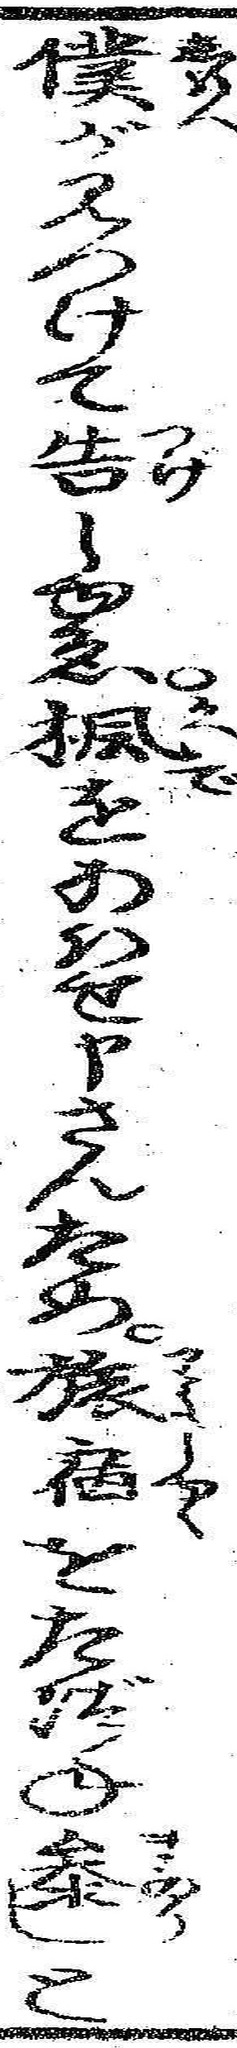僕が見つけて告しゆゑ。楓をあはせ申さんため。旅宿をたづね参しと
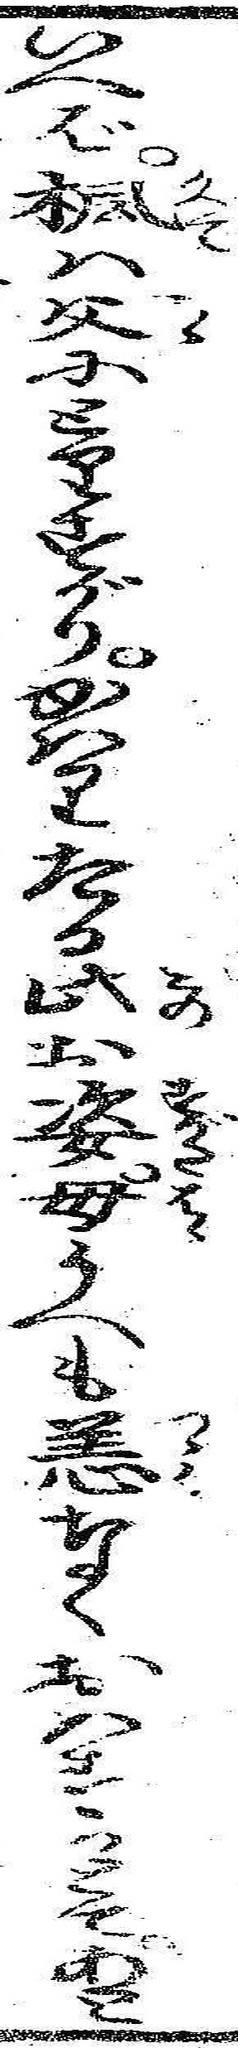いへば。楓は父にとりすがり。かはりたる此お姿。母うへも恙なくおはすかとて。あと
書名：昔話稲妻表紙
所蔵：国文学研究資料館
